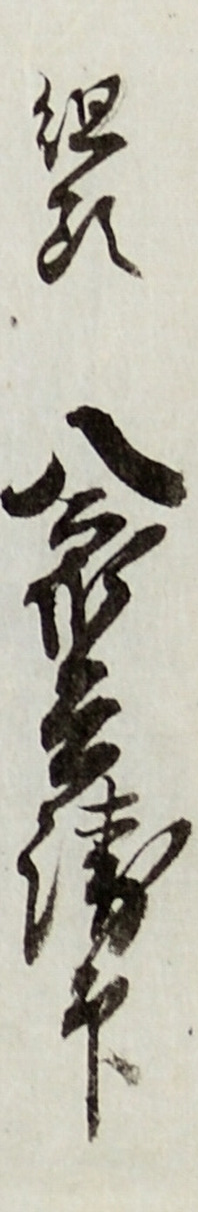組頭八郎兵衛印
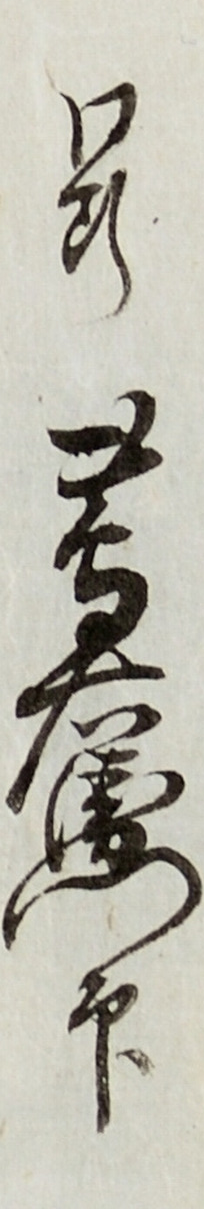同断蔦右衛門印
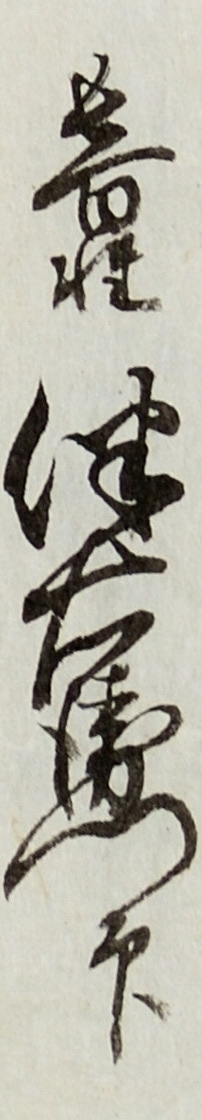長百姓伴右衛門印
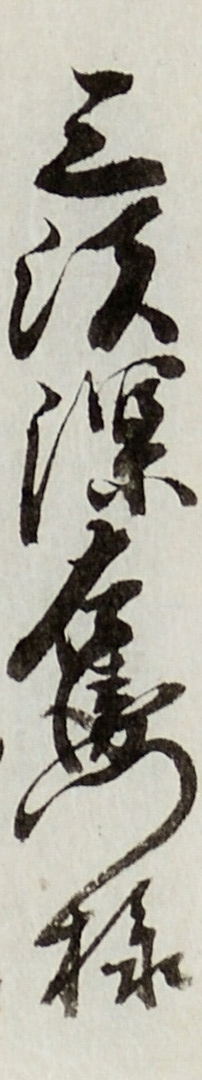三沢深右衛門様
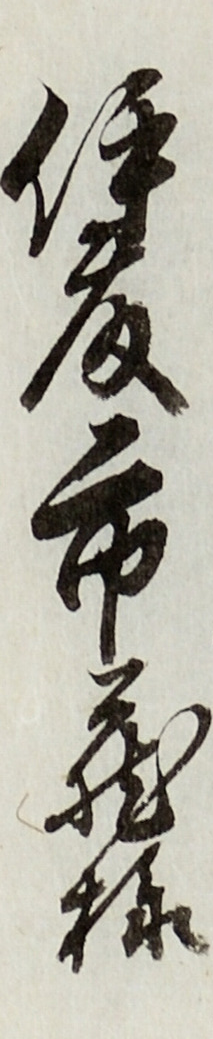伊藤市蔵様
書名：御薪方掟控
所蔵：伊那市立高遠町図書館・合同会社AMANE
